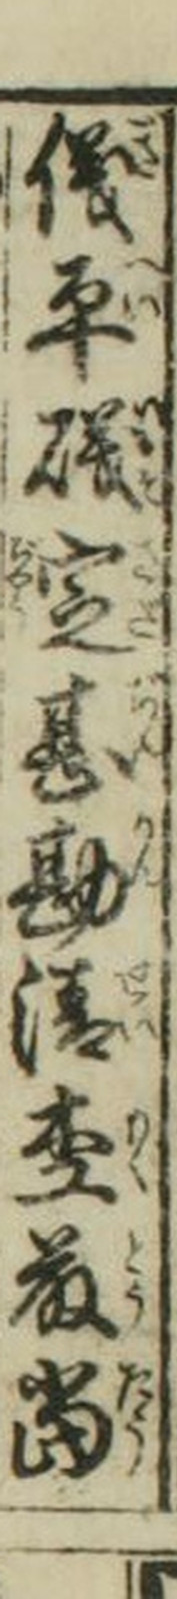儀平磯定甚勘清杢藤当
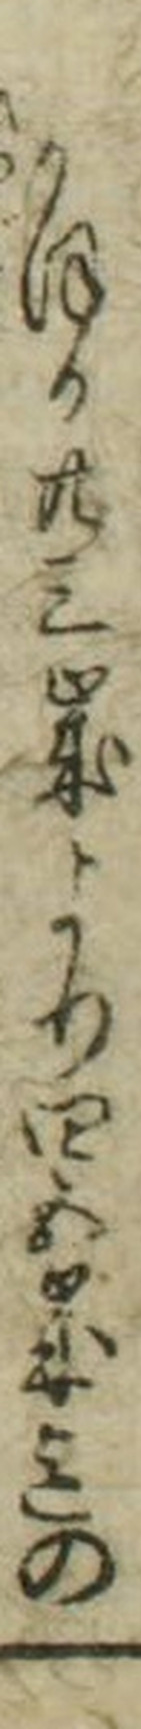かほる廿三歳より四五歳もの
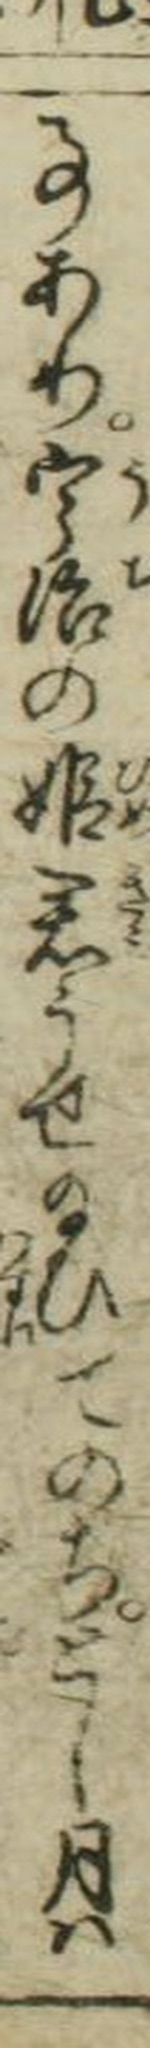事あり。宇治の姫君うせ給ひてのち。とし月は
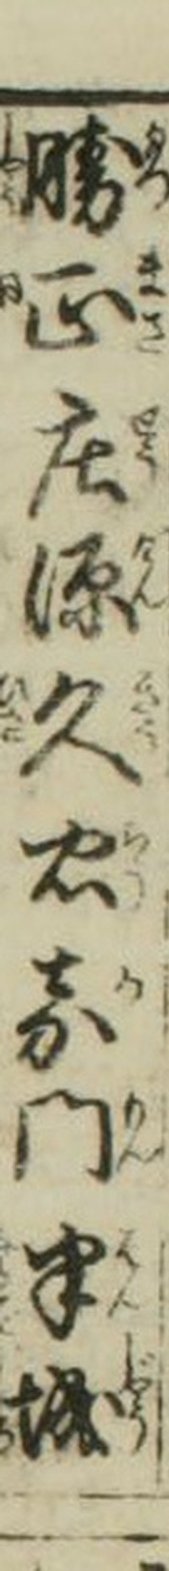勝正庄源久忠嘉門半城
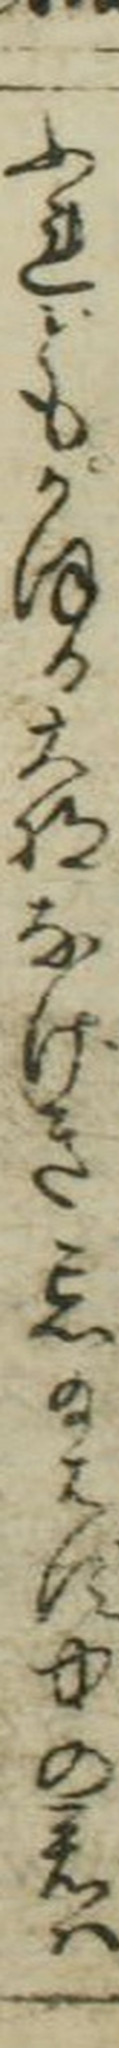ふれども。かほる大将なげき忘給はず。中の君は
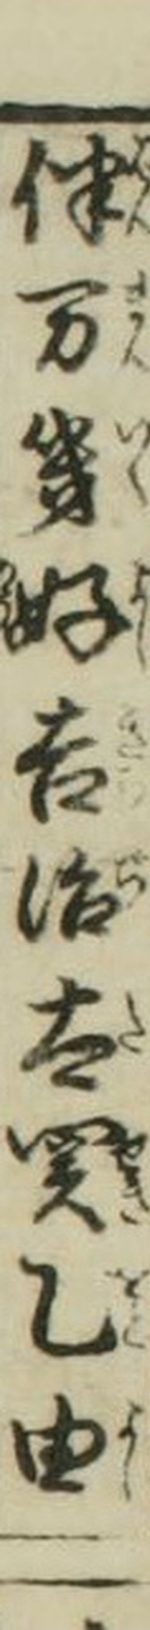伴万幾好吉治太関乙由
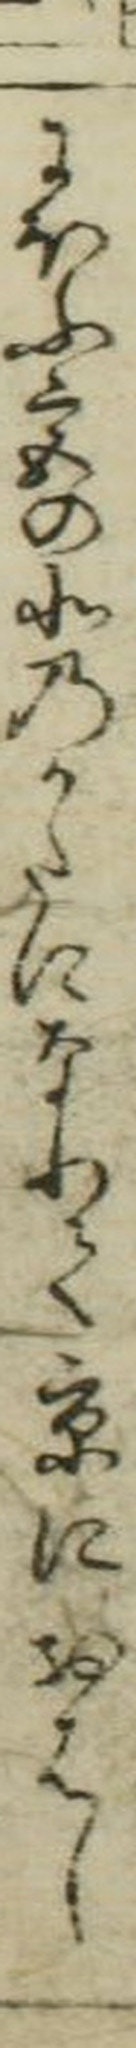にほふ宮の北のかたになりて京におはし
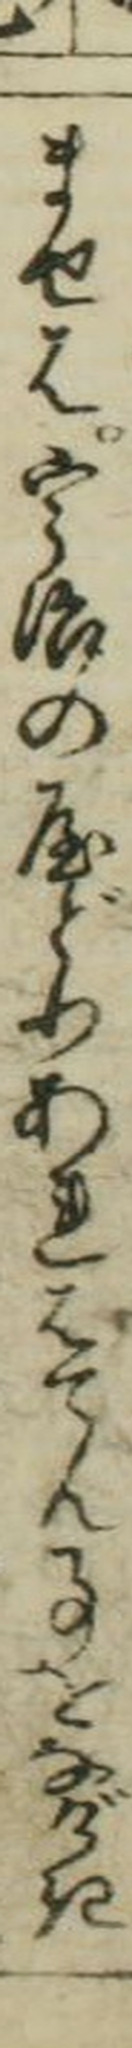ませは。宇治のやどりあれはてん事をなげき
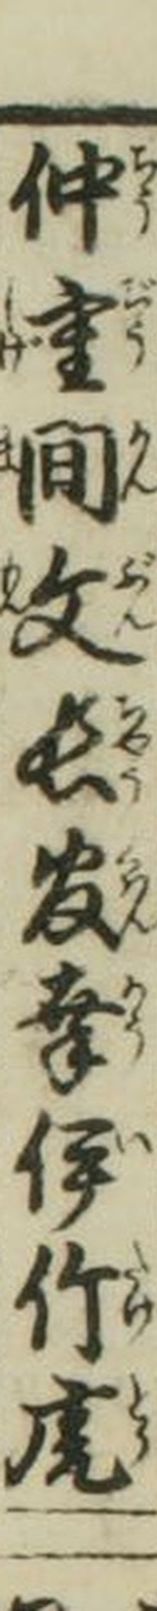仲重間文長官幸伊竹虎
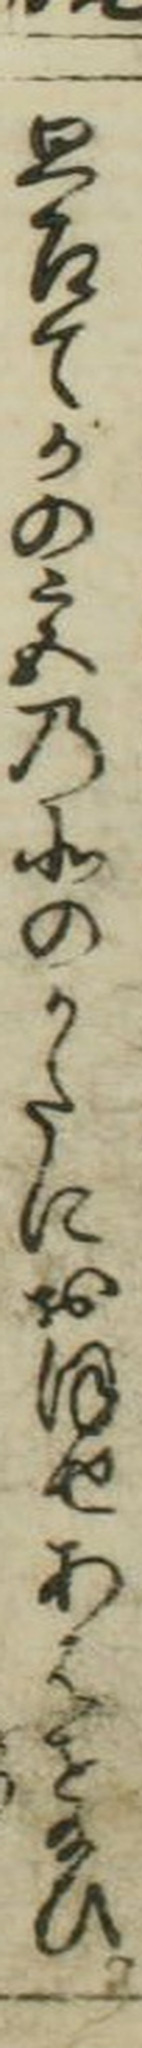思召てかの宮の北のかたにおほせあはせ給ひ。
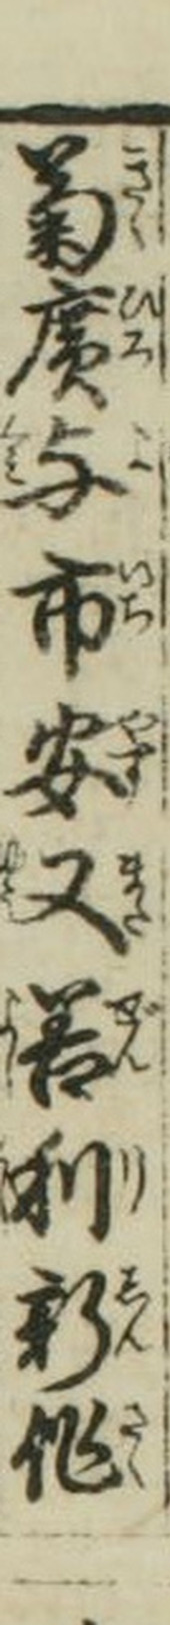菊広与市安又善利新作
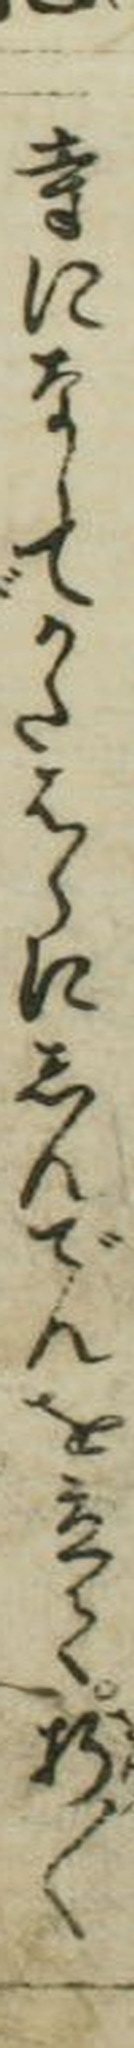寺になしてかたはらにしんでんを立て。折〳〵
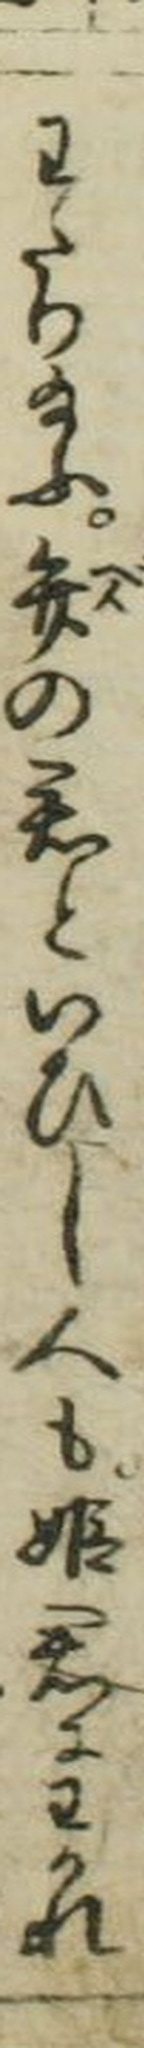わたり給ふ。弁の君といひし人も。姫君にわかれ
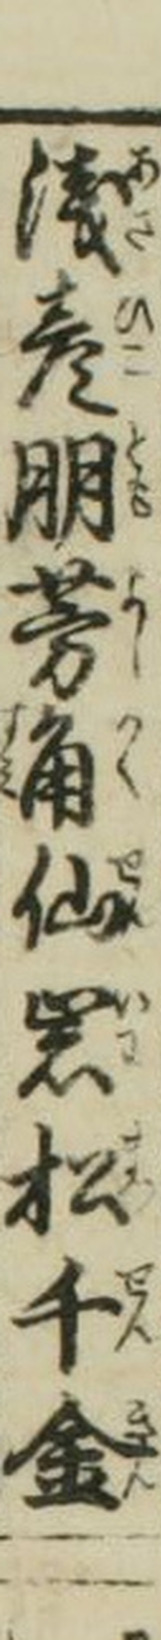浅彦朋芳角仙岩松千金
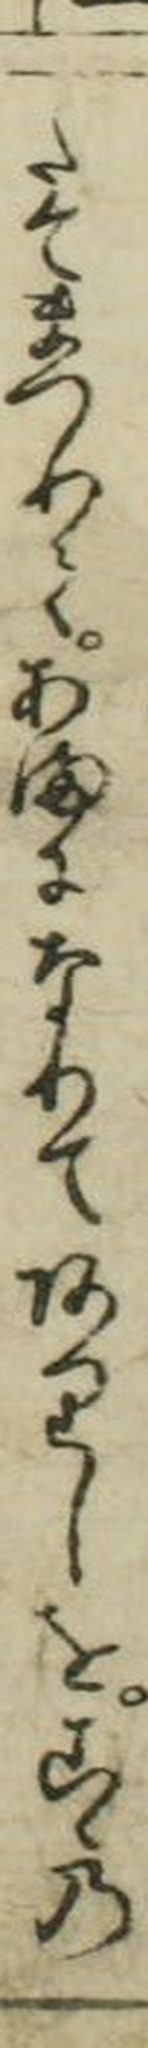たてまつりて。あまになりてありしを。こゝの
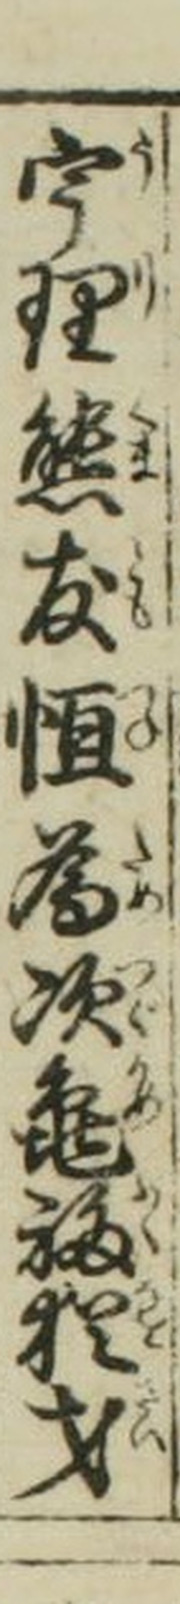宇理熊友恒為次亀福猶才
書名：女源氏教訓鑑
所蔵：東京学芸大学附属図書館
